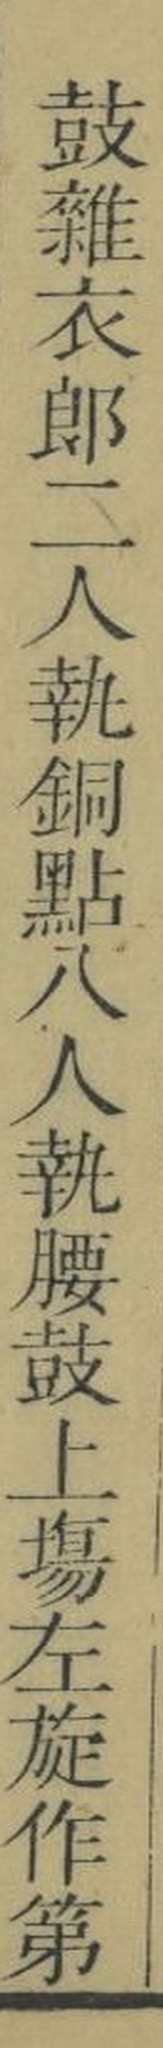鼓雜衣郎二人執銅點八人執腰鼓上塲左旋作第
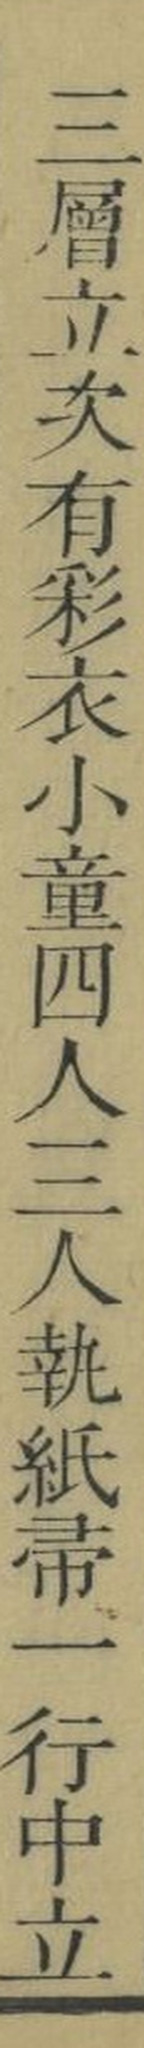三層立次有彩衣小童四人三人執紙帚一行中立
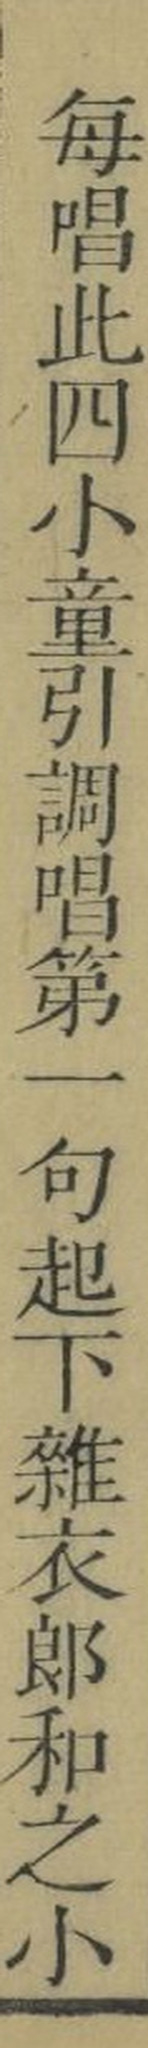每唱此四小童引調唱第一句起下雜衣郎和之小
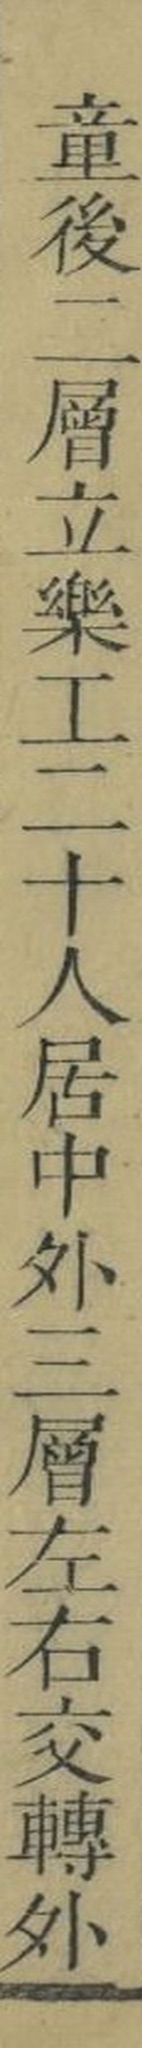童後二層立樂工二十人居中外三層左右交轉外
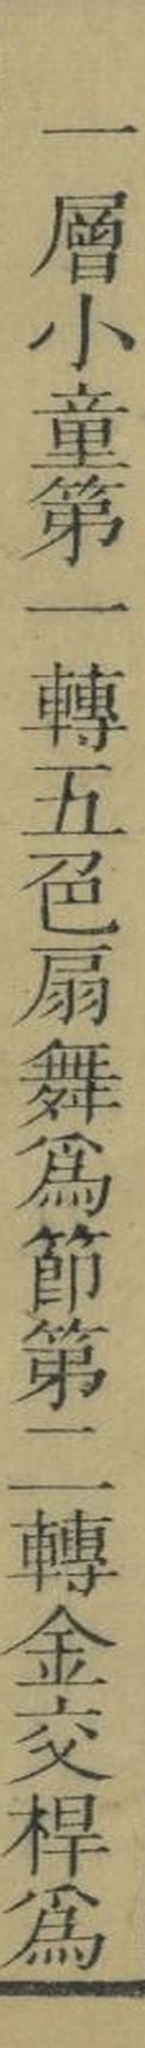一層小童第一轉五色扇舞爲節第二轉金交桿爲
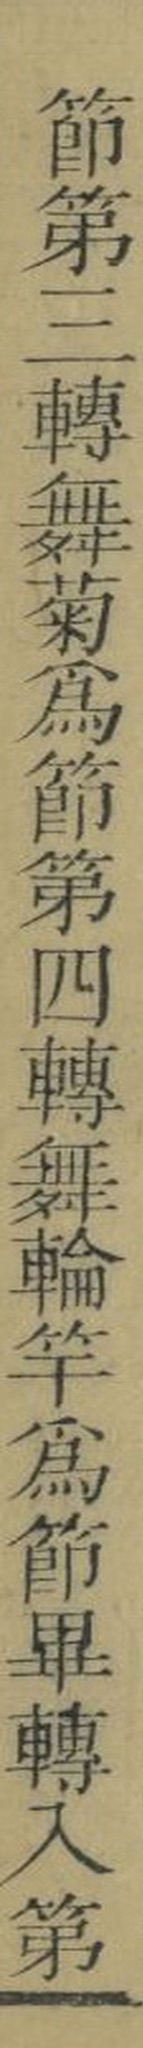節第三轉舞菊爲節第四轉舞輪竿爲節畢轉入第

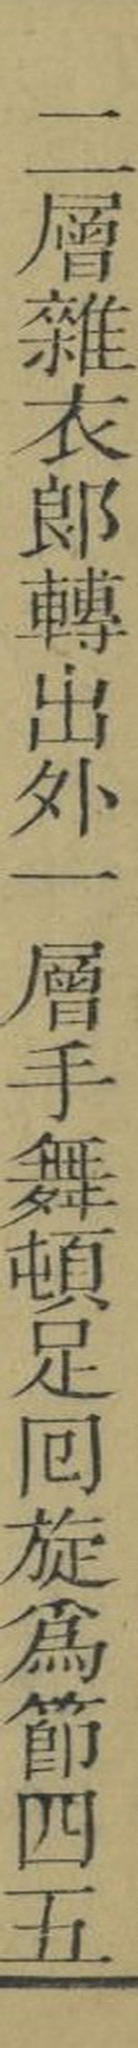二層雜衣郎轉出外一層手舞頓足囘旋爲節四五
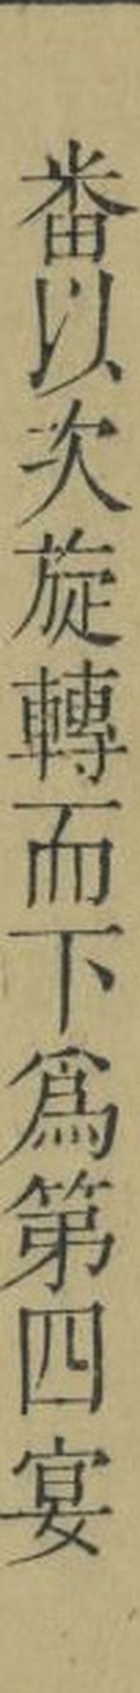畨以次旋轉而下爲第四宴
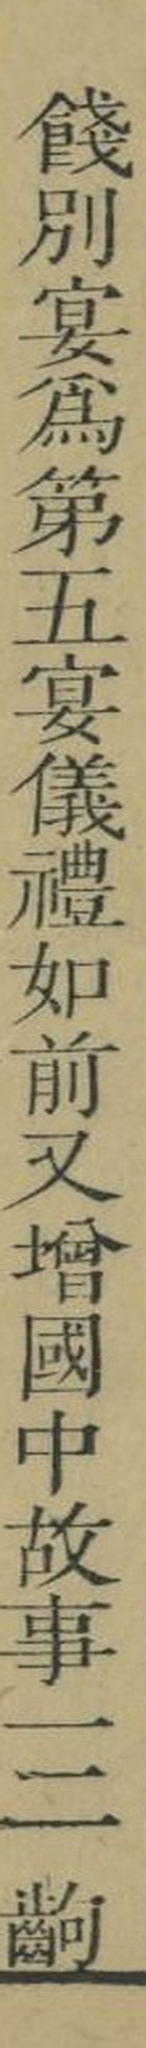餞別宴爲第五宴儀禮如前又增國中故事一二齣
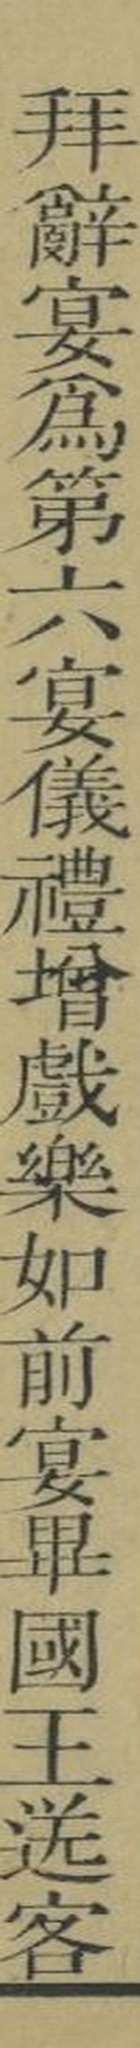拜辭宴爲第六宴儀禮增戲樂如前宴畢國王送客
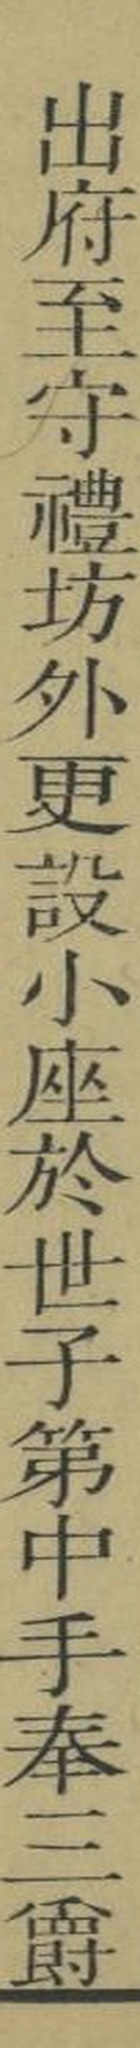出府至守禮坊外更設小座於世子第中手奉三爵
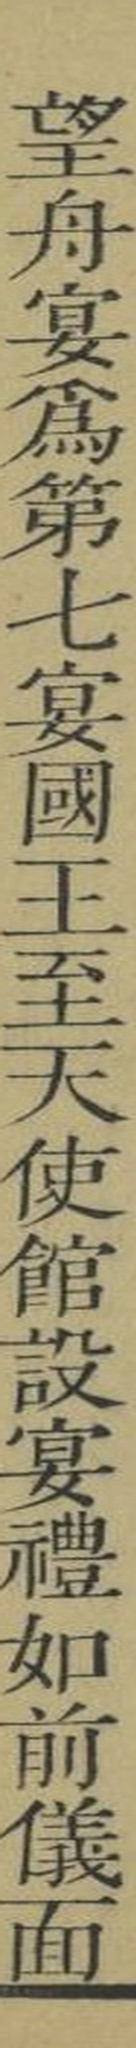望舟宴爲第七宴國王至天使館設宴禮如前儀面
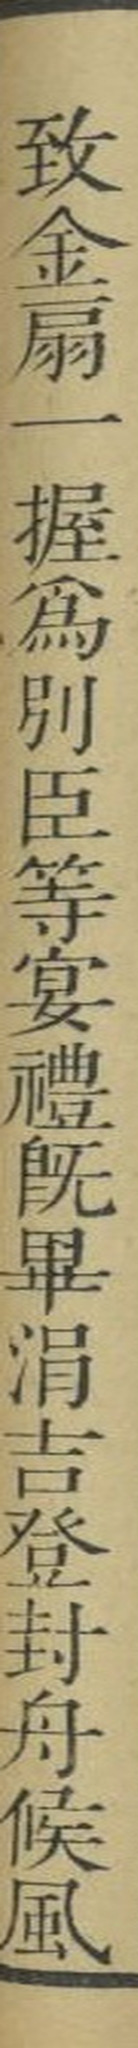致金扇一握爲別臣等宴禮既畢涓吉登封舟候風
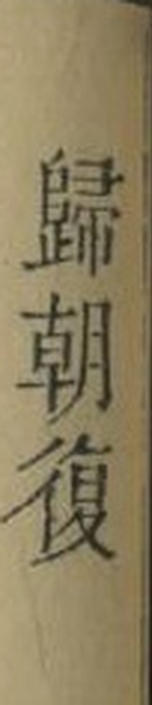歸朝復
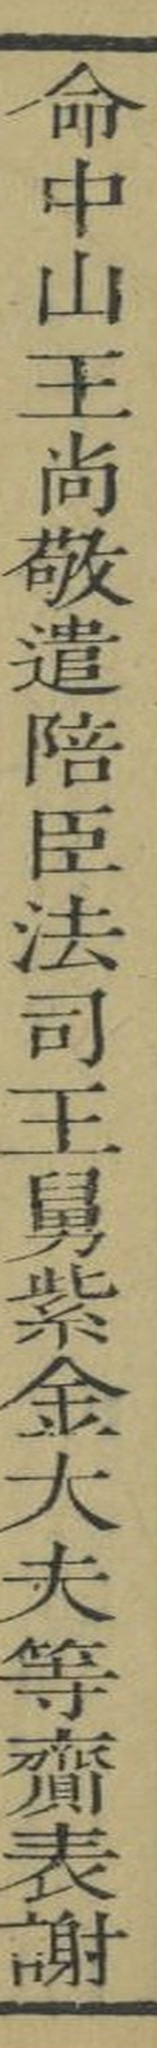命中山王尚敬遣陪臣法司王舅紫金大夫等齎表謝
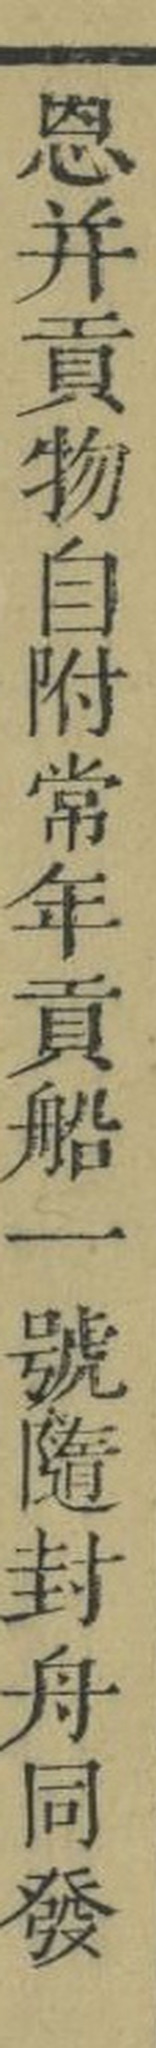恩并貢物自附常年貢船一號隨封舟同發
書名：中山伝信録 巻二
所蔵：University of the Ryukyus Library
